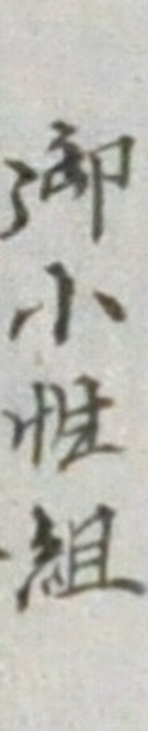御小姓組
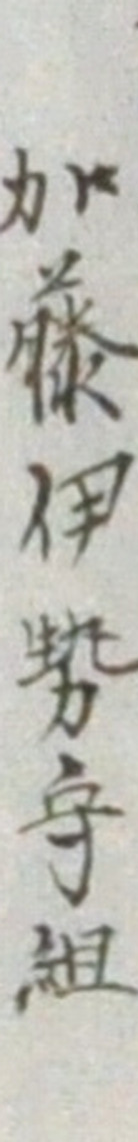加藤伊勢守組
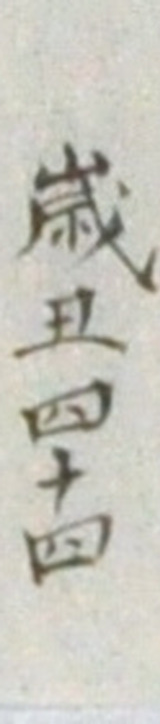歳丑四十四
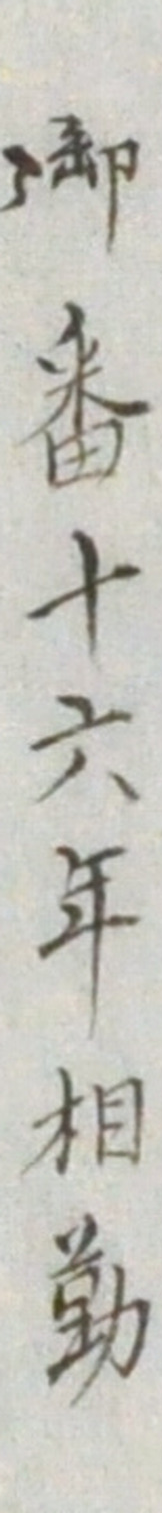御番十六年相勤
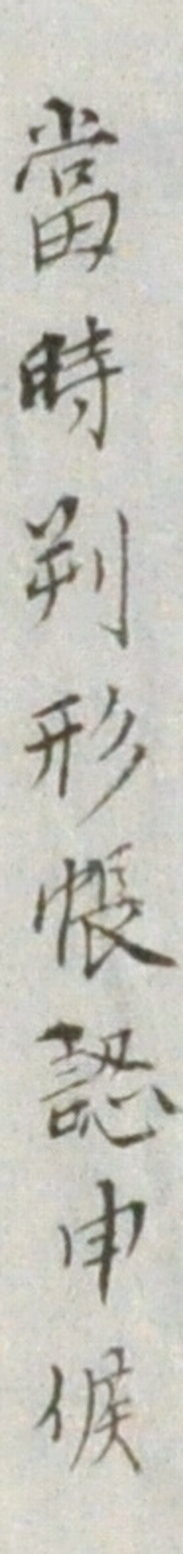当時判形帳認申候
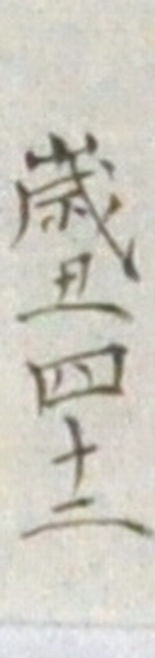歳丑四十二
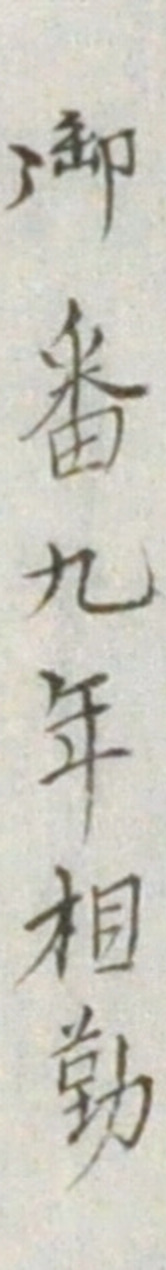御番九年相勤
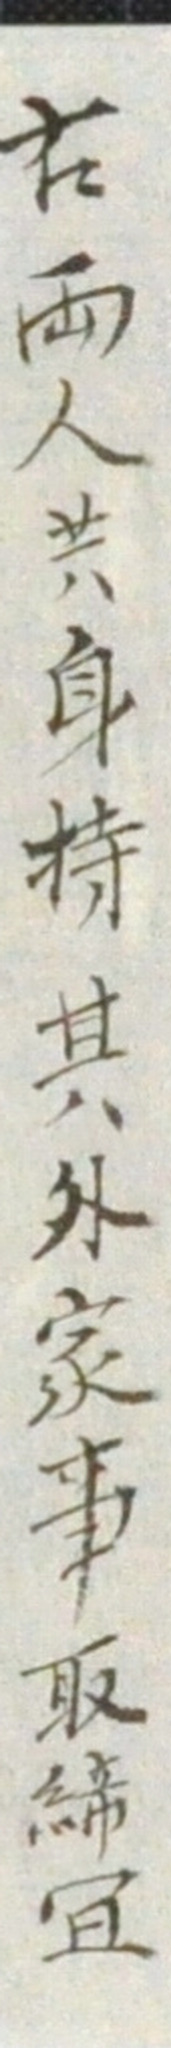右両人共身持其外家事取締宜
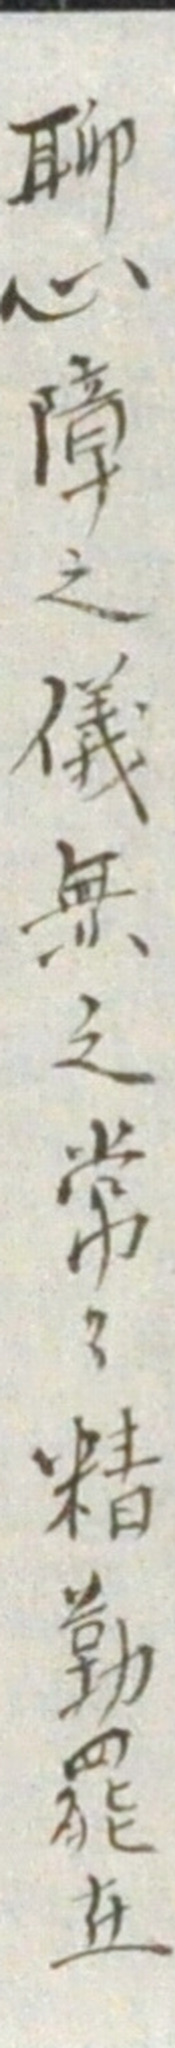聊心障之儀無之常々精勤罷在
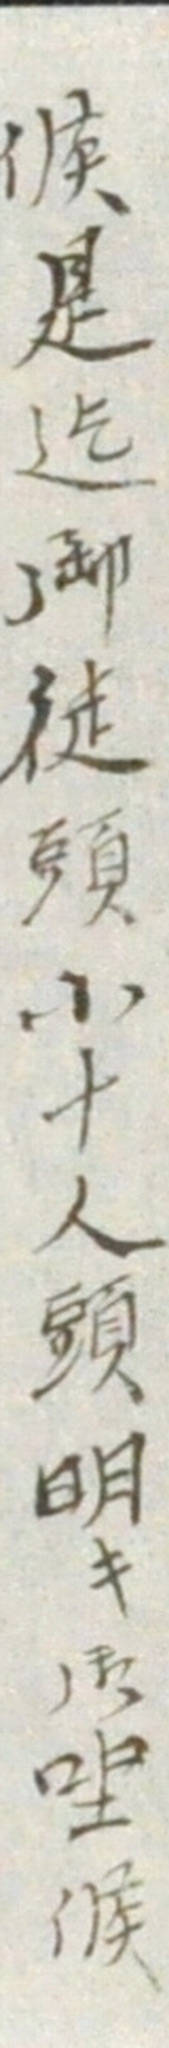候是迄御徒頭小十人頭明き御坐候
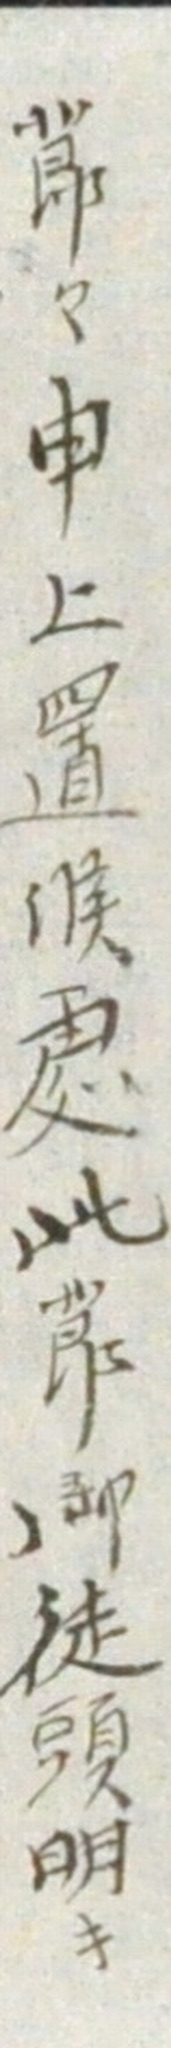節々申上置候處此節御徒頭明き
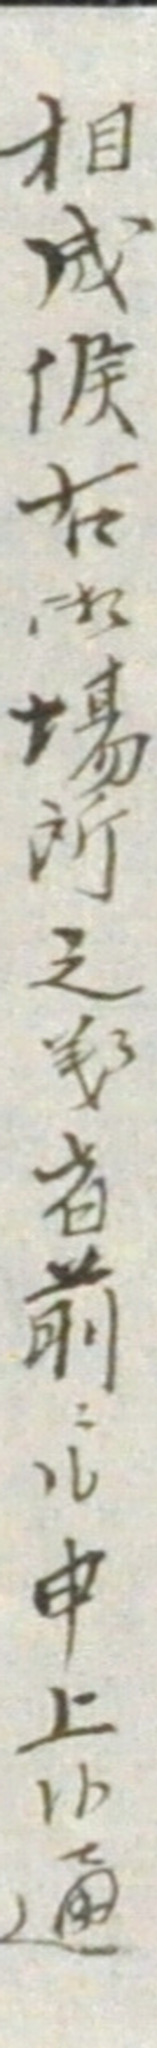相成候右御場所之儀者前ニも申上候通
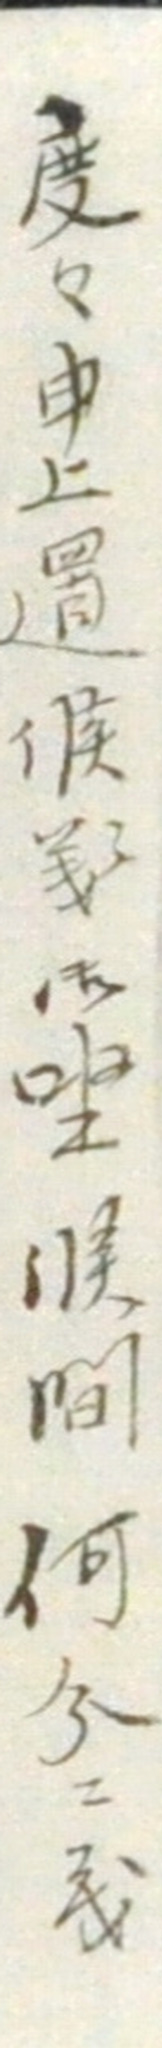度々申上置候儀御坐候間何分ニ茂
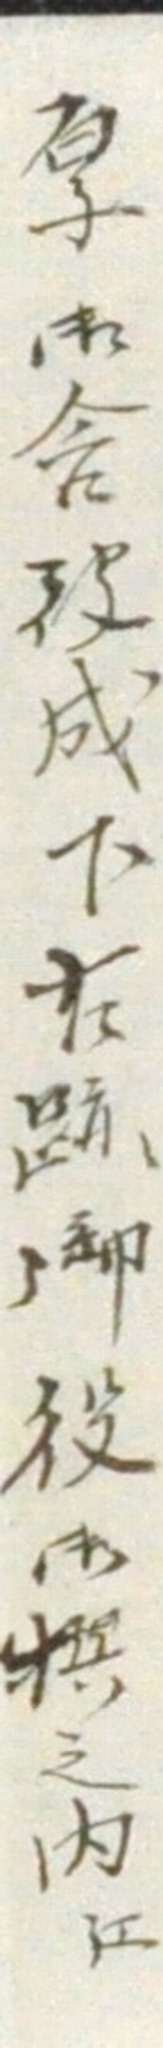厚御含被成下右跡御役御撰之内江
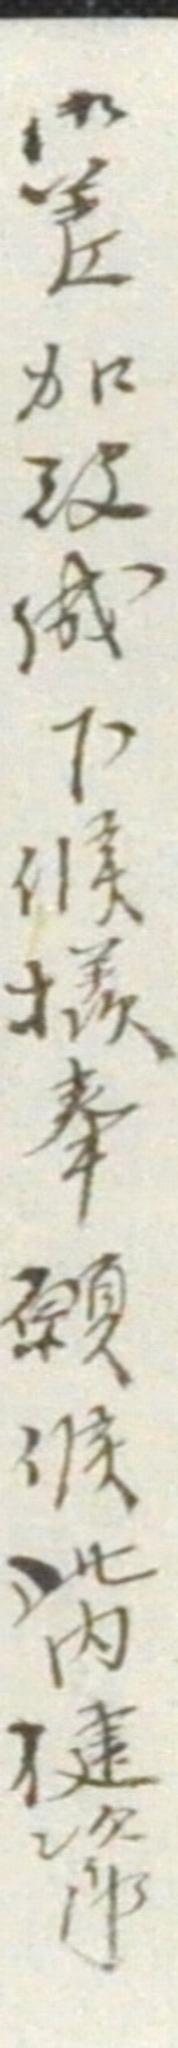御差加被成下候様奉願候此内健次郎
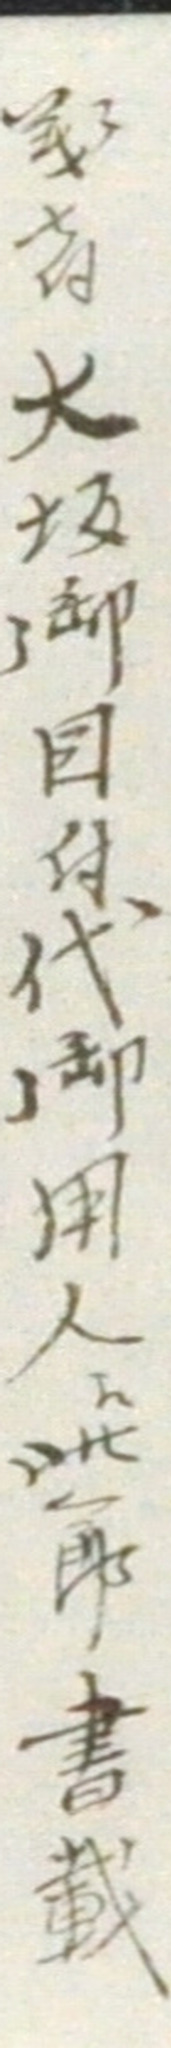義者大坂御目付代御用人江此節書載
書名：若年寄御役中御調書付
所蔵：伊那市立高遠町図書館・合同会社AMANE
